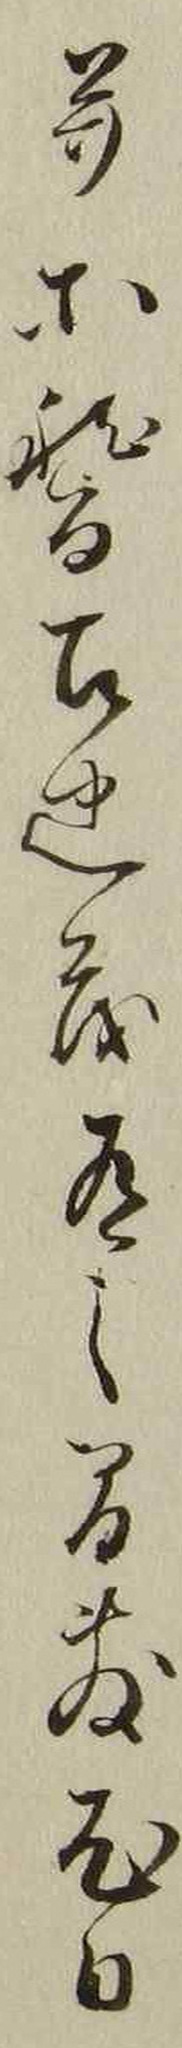並等稽古迚も有之間敷尤日
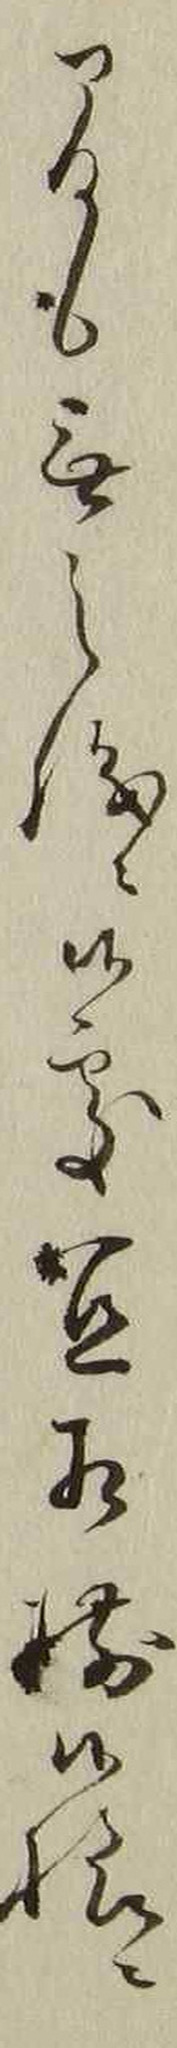間も無之儀ニ候処宜相揃候様ニ
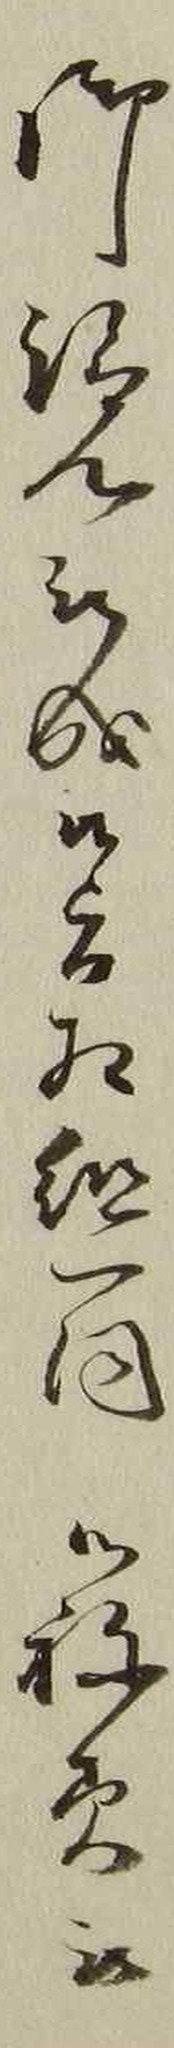御覧被成候旨相組一同御称美被
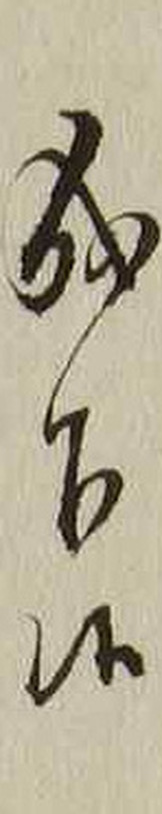成下候
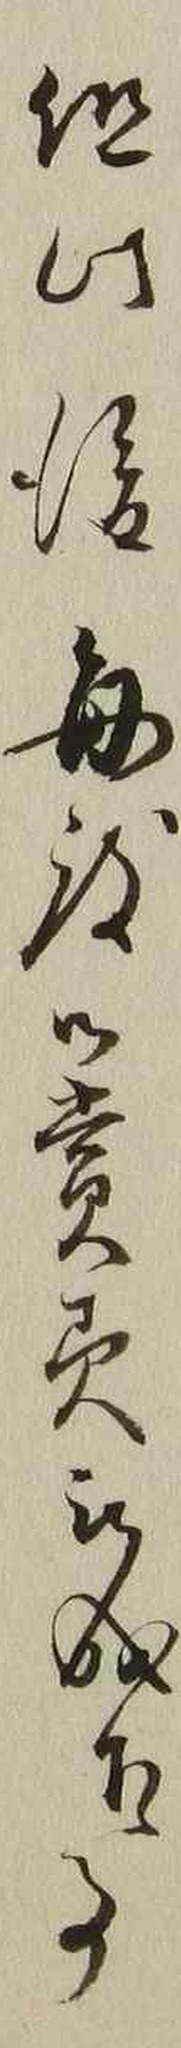但此後毎度御賞美被成下候事
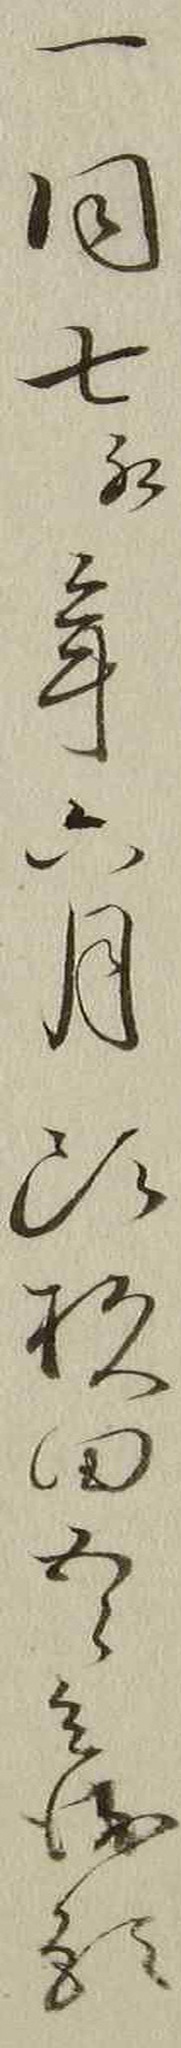一同七卯年六月頭杉田五郎兵衛願
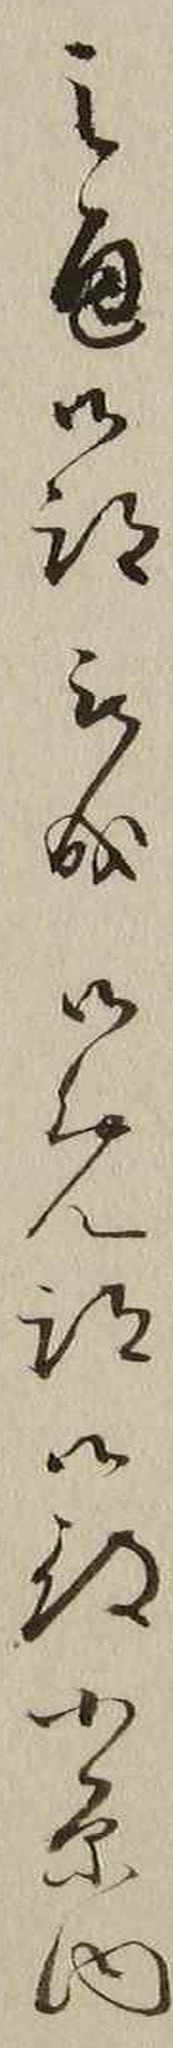之通御跡被成御免跡御役小原内
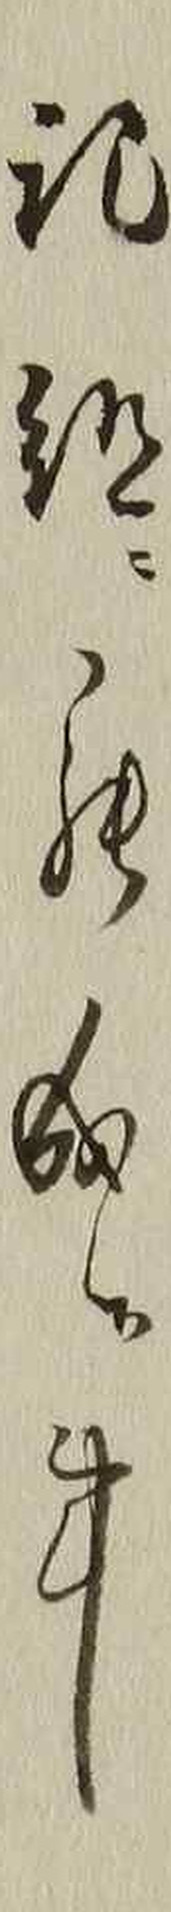記組ニ罷成候事
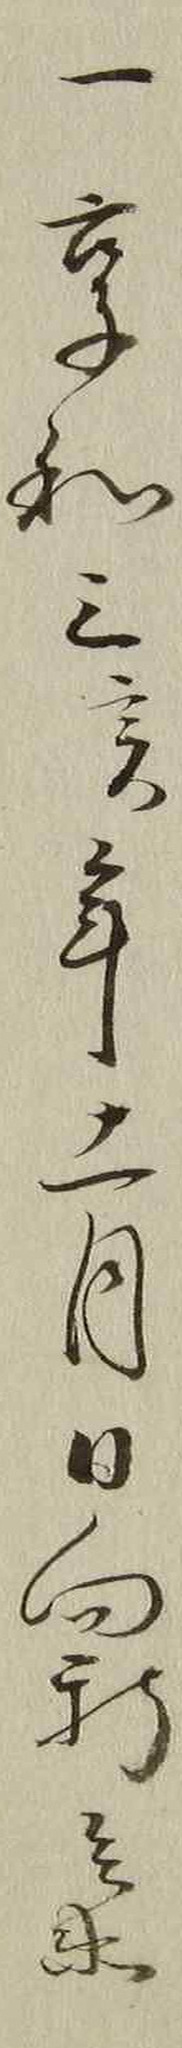一享和三亥年十一月日向新兵衛
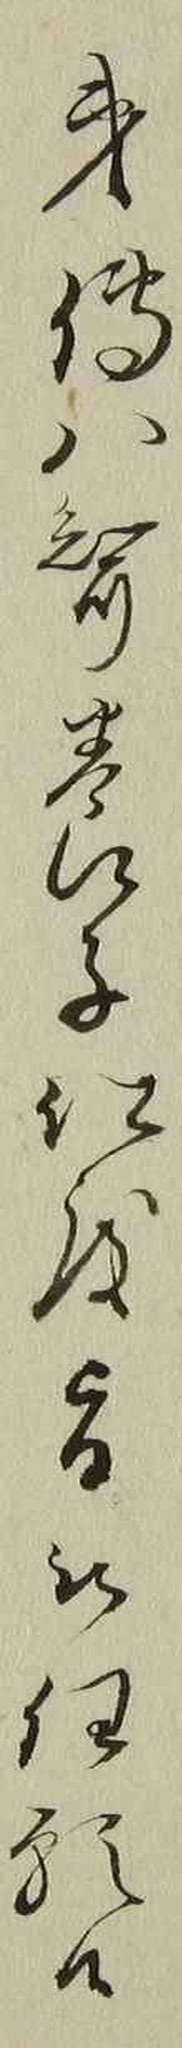弟伝八婿養子仕度旨被任願候
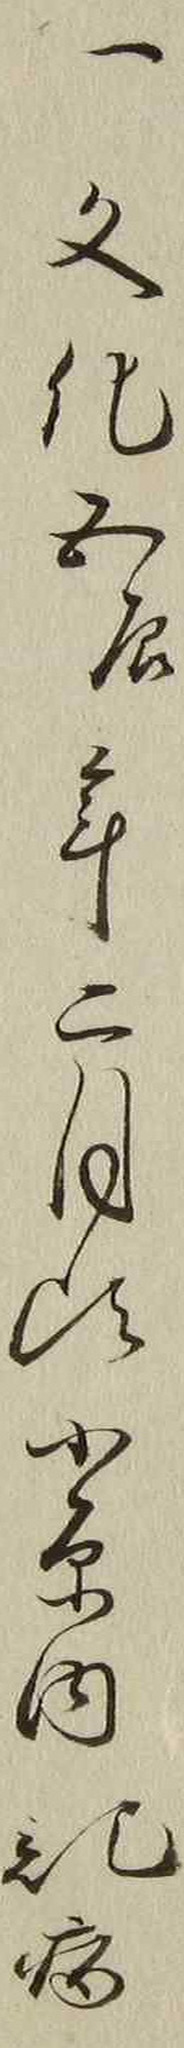一文化五辰年二月頭小原内記病
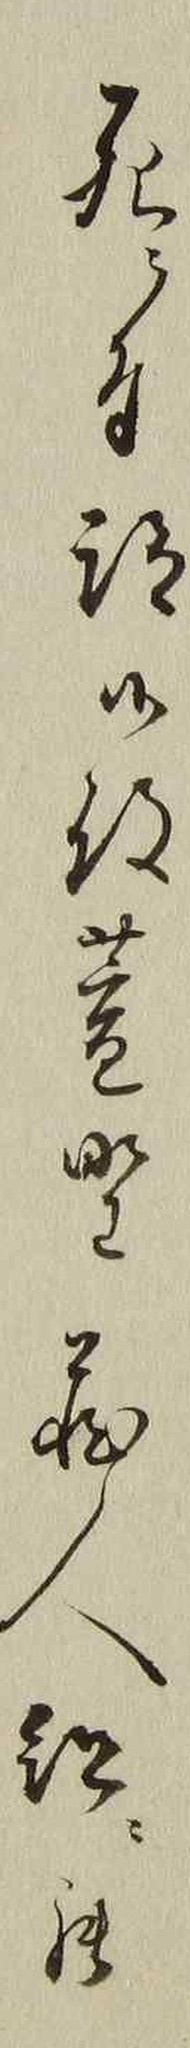死ニ付跡御役萱野蔵人組ニ罷
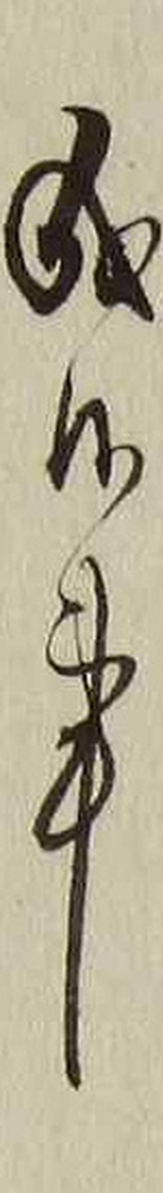成候事
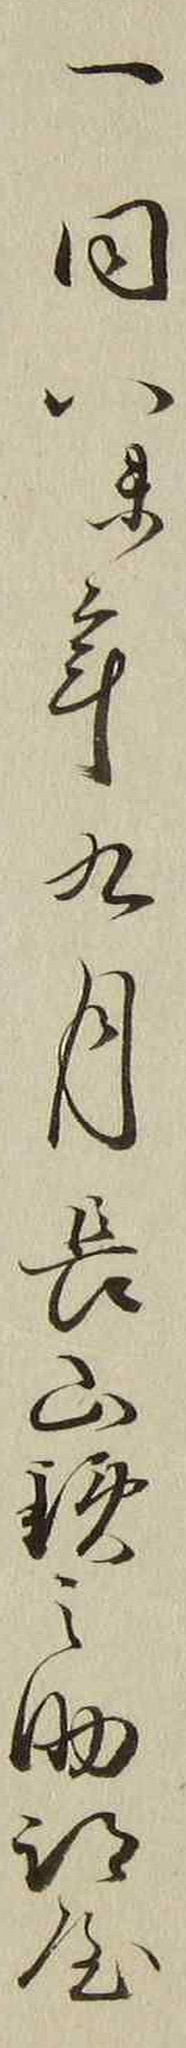一同八未年九月長山鉄之助跡屋
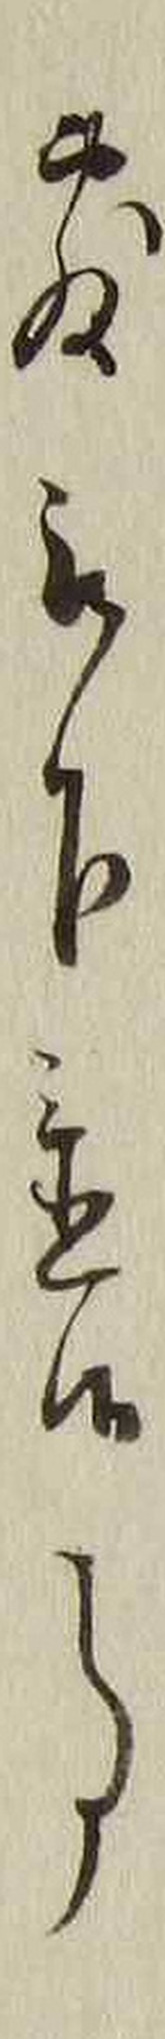敷被下置候事
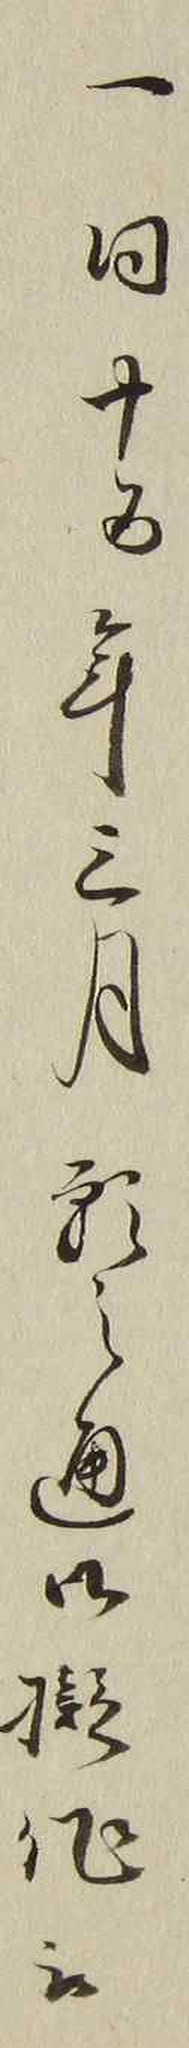一同十酉年三月願之通御擬作被
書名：諸士系譜　巻之129　た之部5
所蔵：会津若松市立会津図書館
